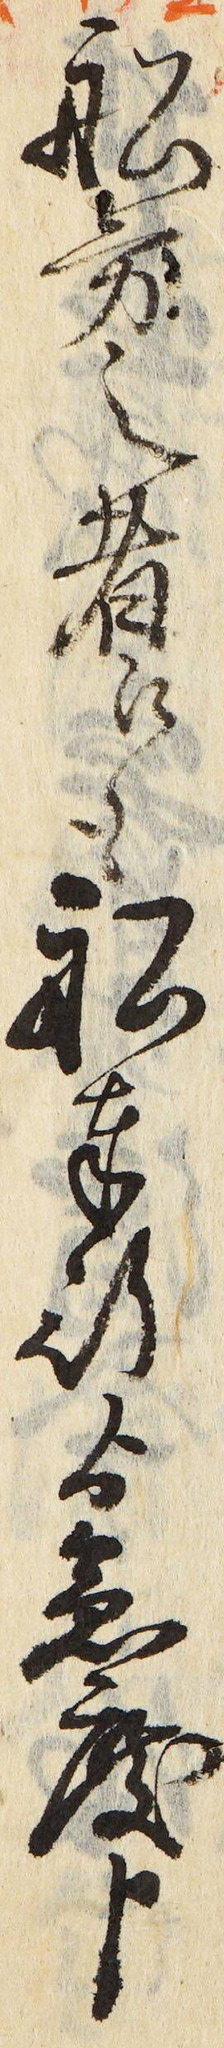船方之者江も船奉行ゟ急度申

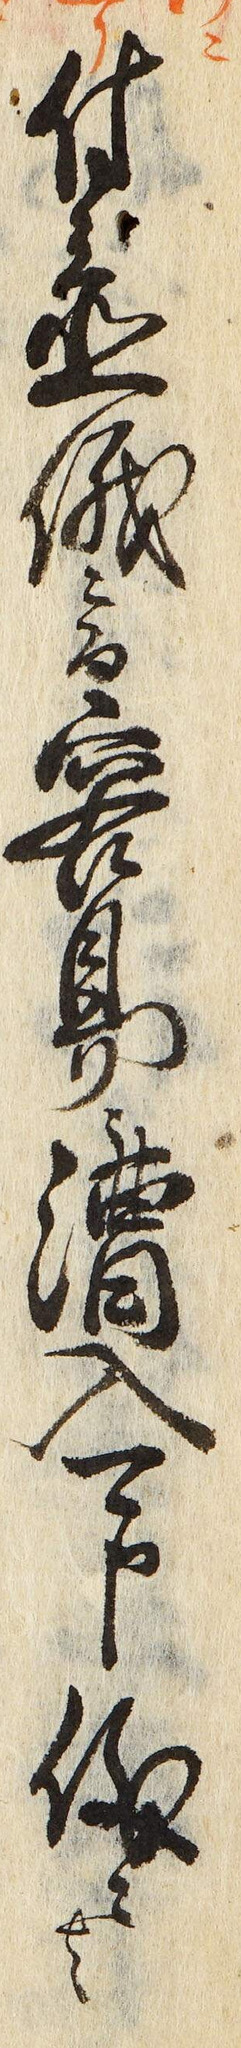付置儀ニ而容易漕入可申儀ニ者
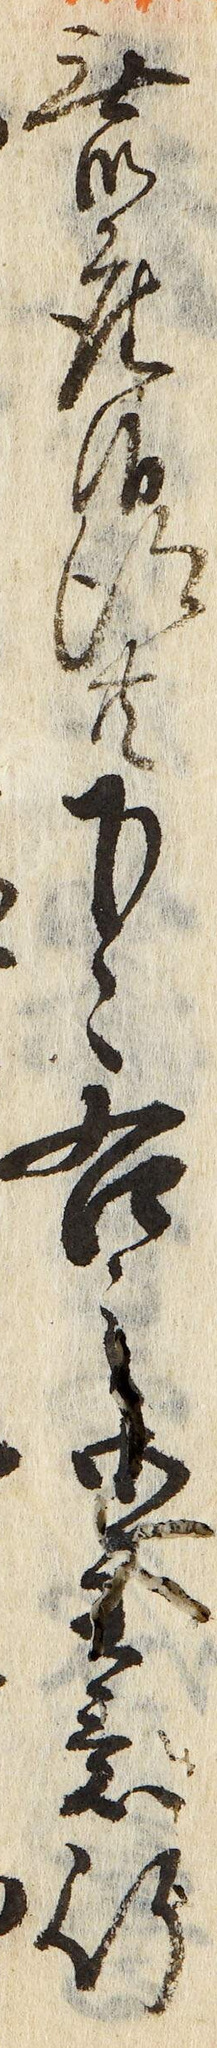無御座候得共下々右之御主意行
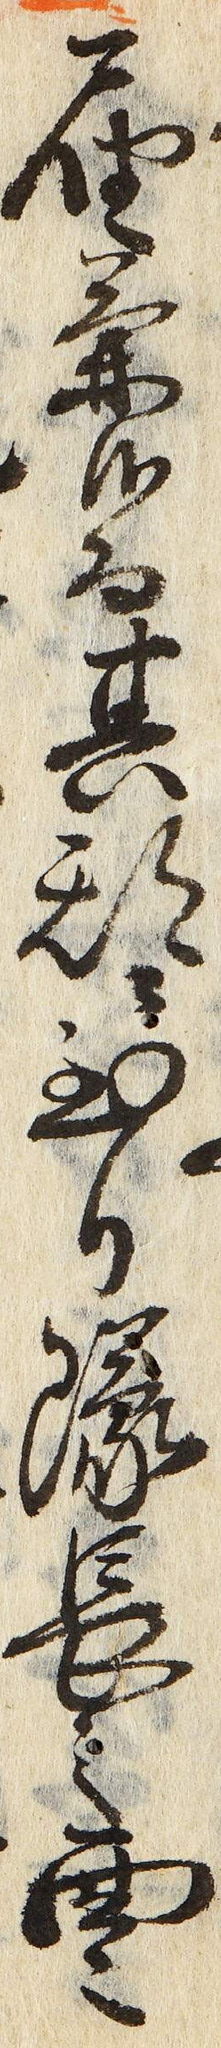届兼候而其期ニ至り隊長之面々
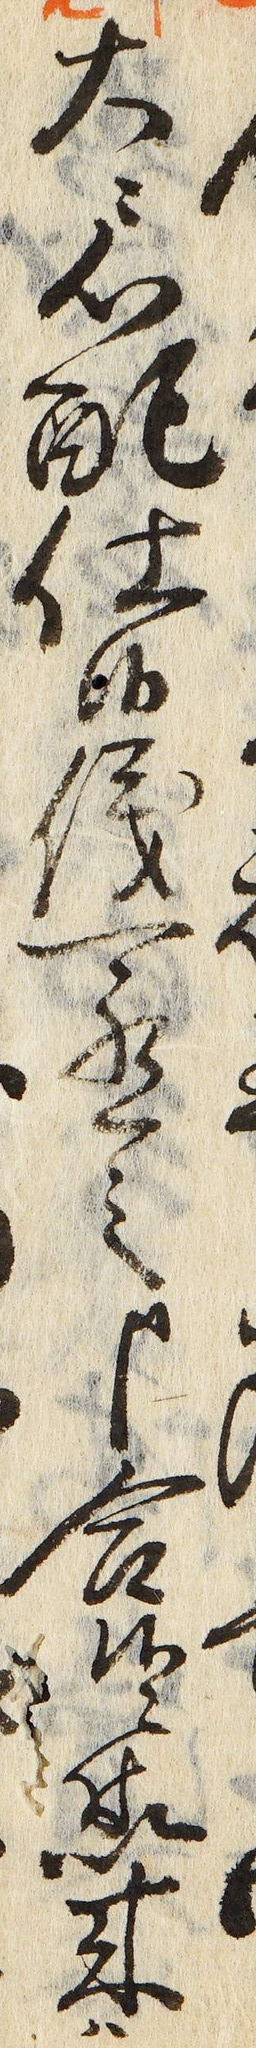大ニ心配仕候儀可有之申合候ニ付以来ハ
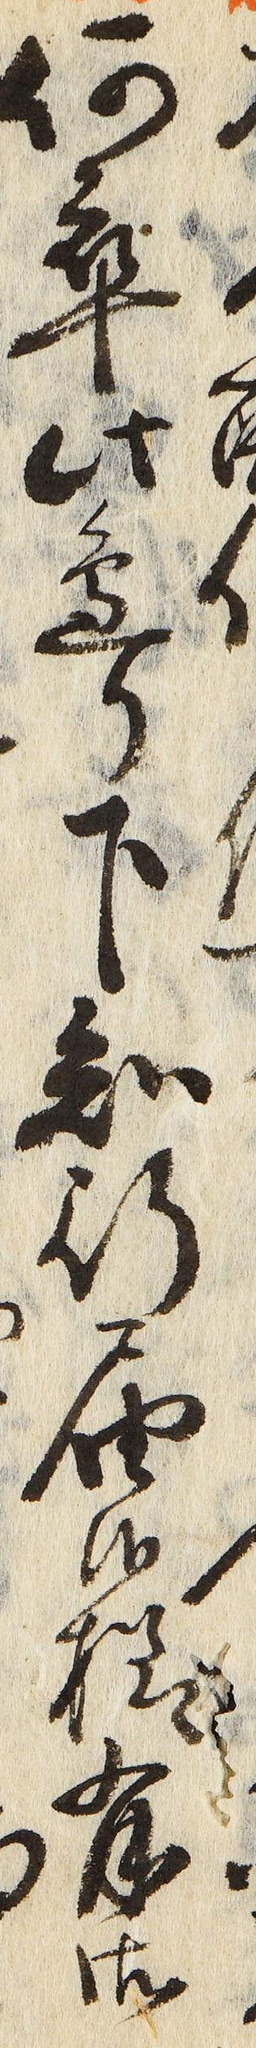何卒此辺り下知行届候様有御
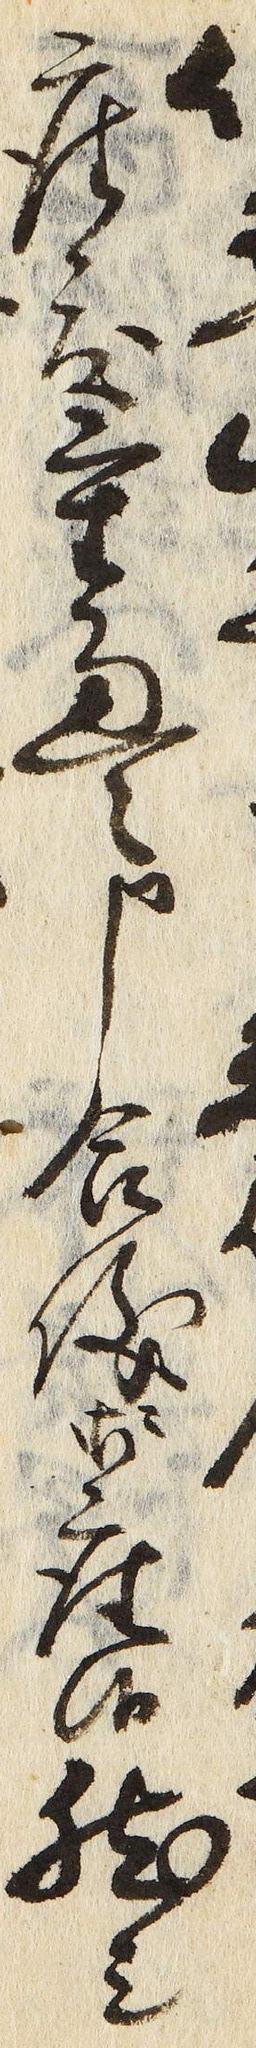在候度重畳申合儀ニ御座候然シ
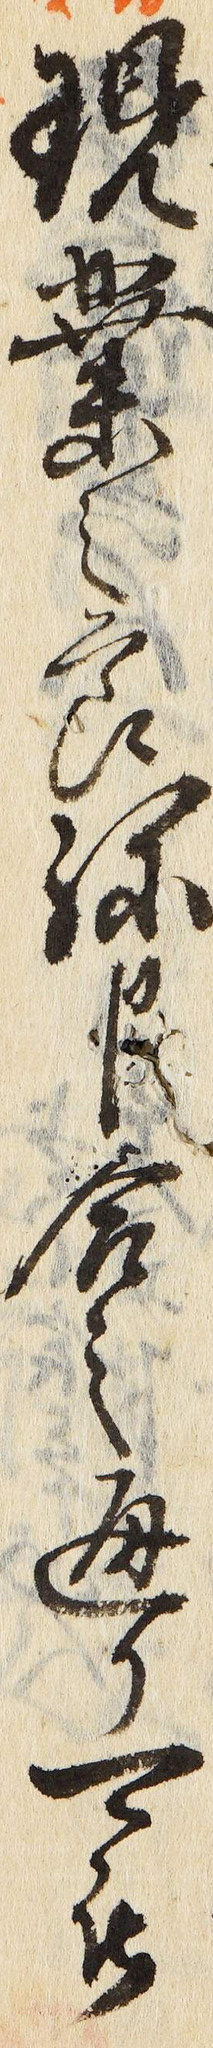現業之節弥申合之通り可被
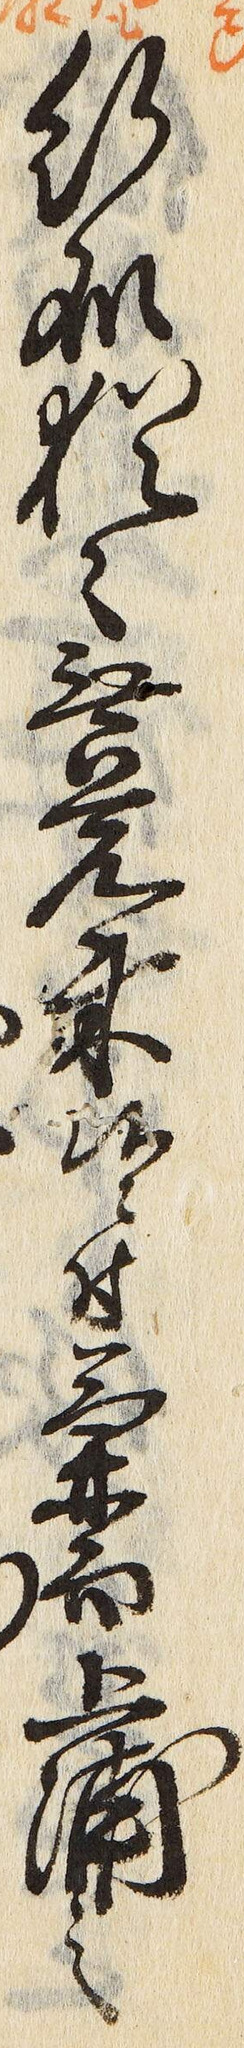行処猶々無覚束候ニ付兼而上浦之
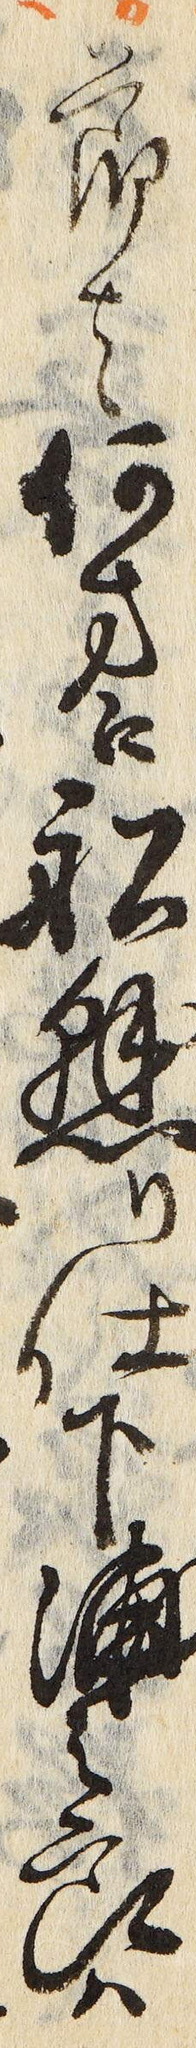節者何方江船懸り仕下浦之節ハ
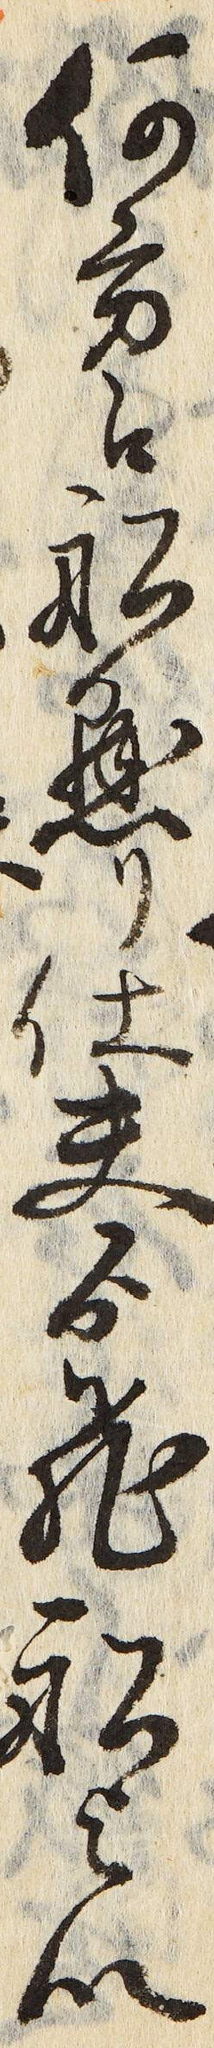何方江船懸り仕夫ゟ飛船与以
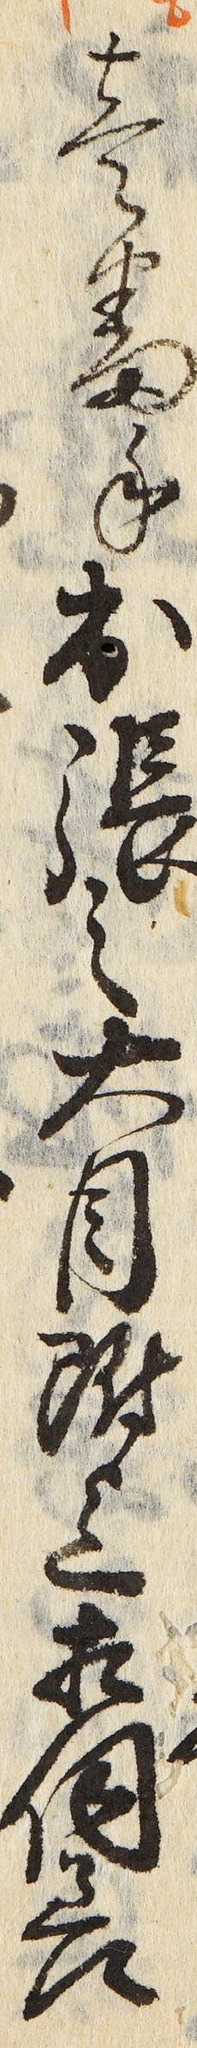壱番手出張之大目付迄相伺差
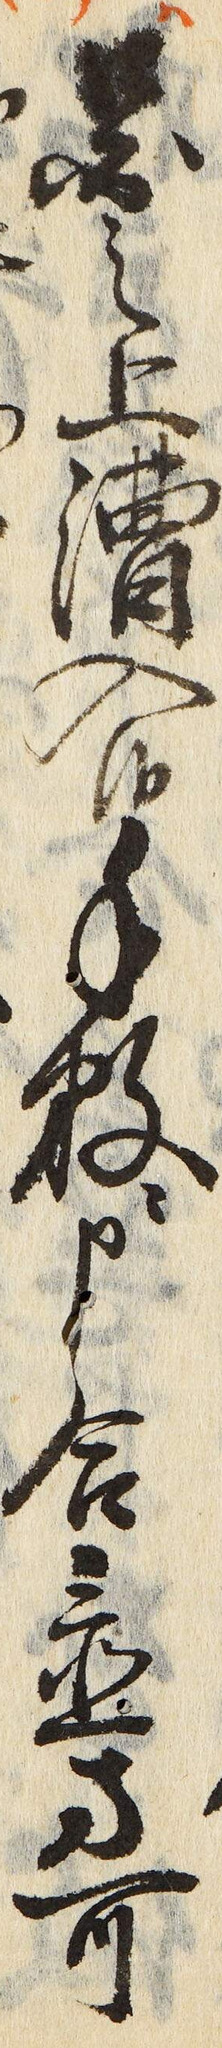図之上漕入候手数ニ申合置方可
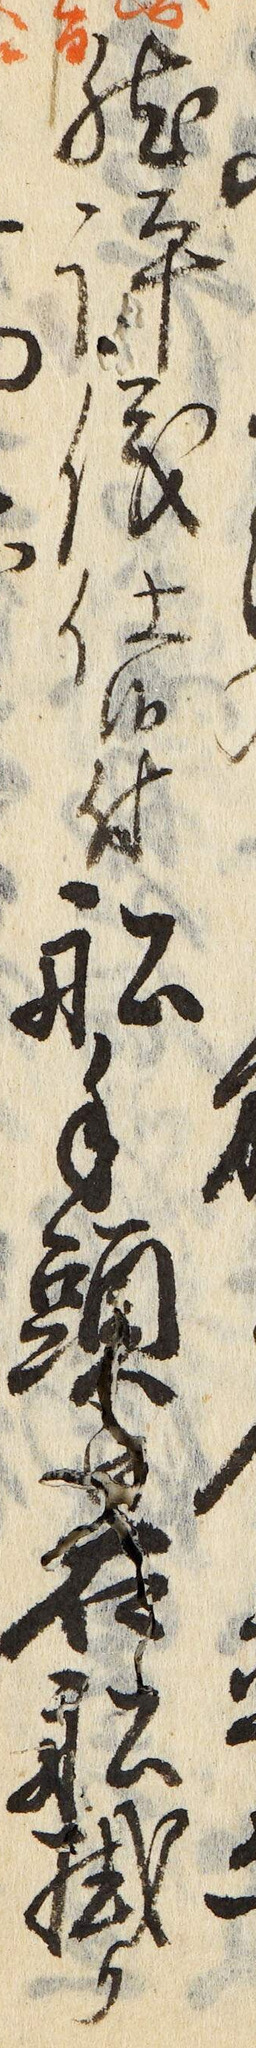然評儀仕候付舟手頭船掛り
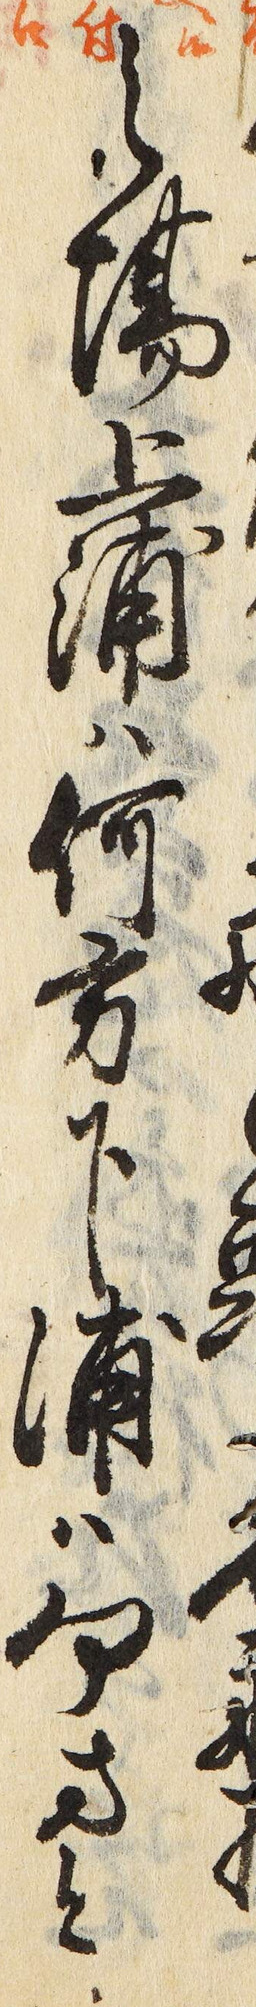之場上浦ハ何方下浦ハハ何方と

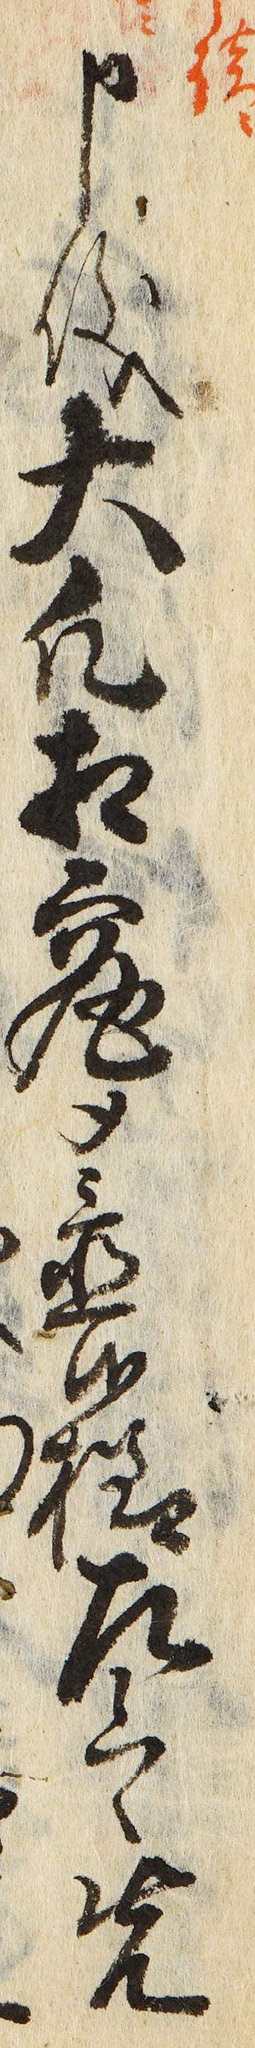申儀大凡相究メ置候様左候ハヽ先
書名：御領海江異国船漂流有之節御手当之次第大組頭心得之廉々書集記
